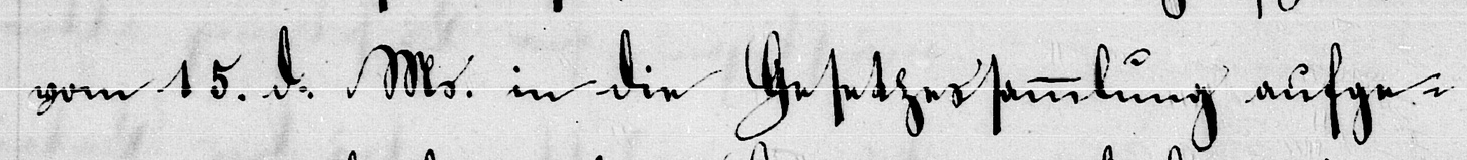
vom 15. d. Ms. in die Gesetzessammlung aufge¬
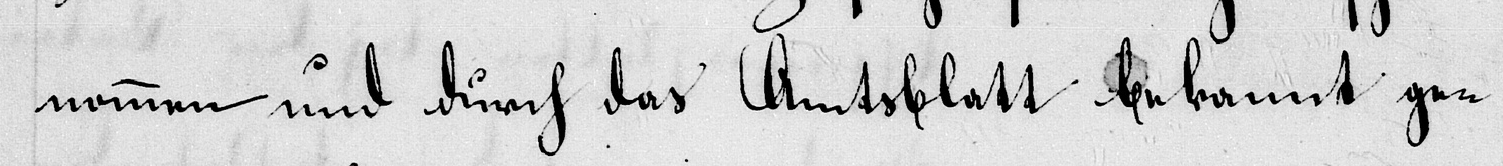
nommen und durch das Amtsblatt bekannt ge¬
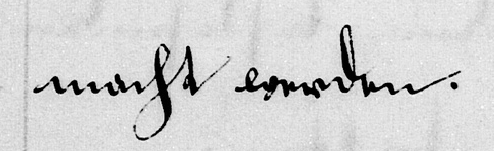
macht werden.
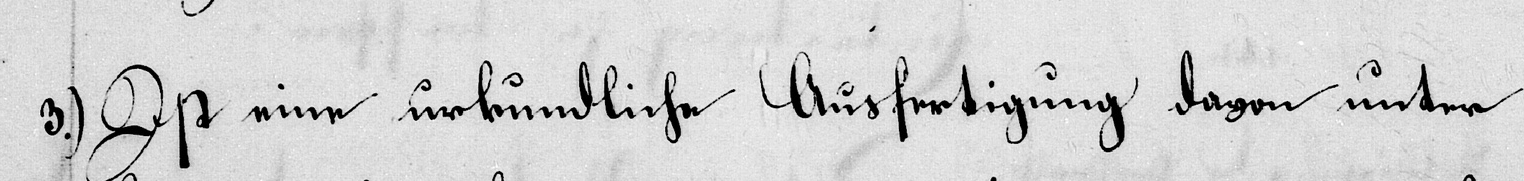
3.) Ist eine urkundliche Ausfertigung davon unter
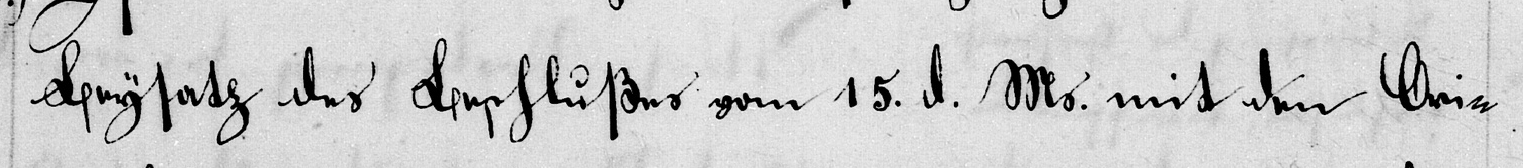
Beysatz des Beschlußes vom 15. d. Ms. mit den Ori¬
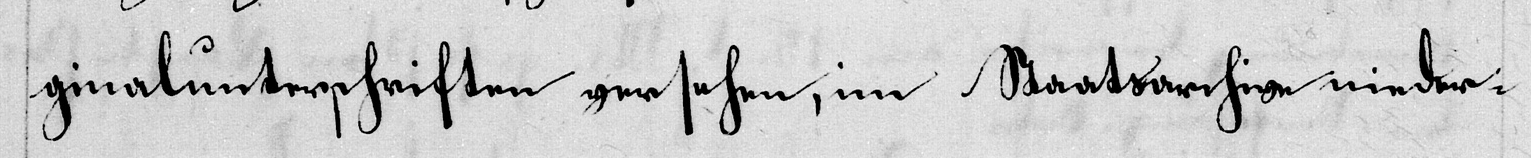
ginalunterschriften versehen, im Staatsarchive nieder¬
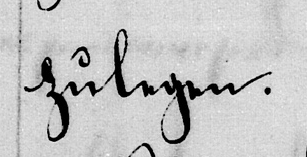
zulegen.
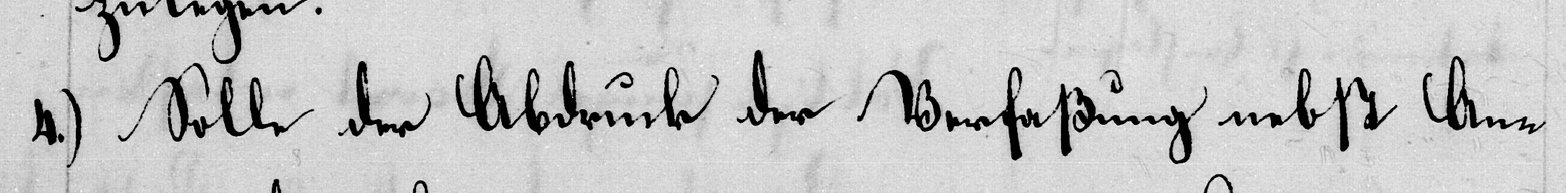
4.) Solle der Abdruck der Verfaßung nebst An¬
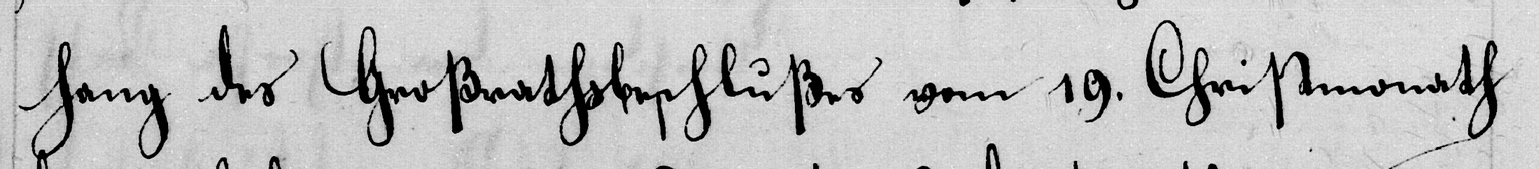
hang des Großrathsbeschlußes vom 19. Christmonath
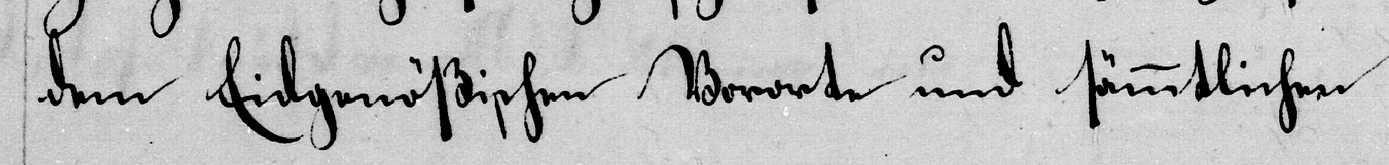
dem Eidgenößischen Vororte und sämmtlichen
